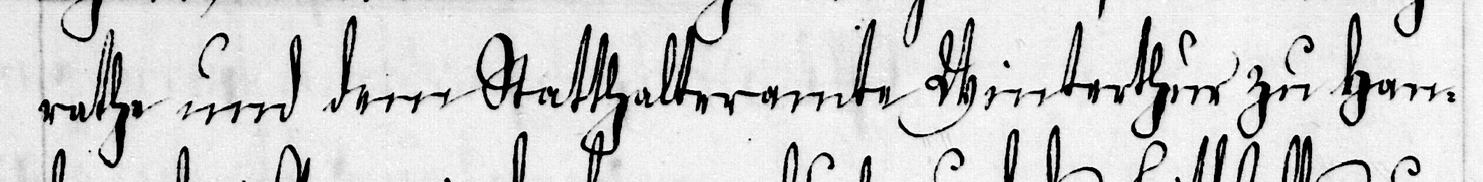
rathe und dem Statthalteramte Winterthur zu Han¬
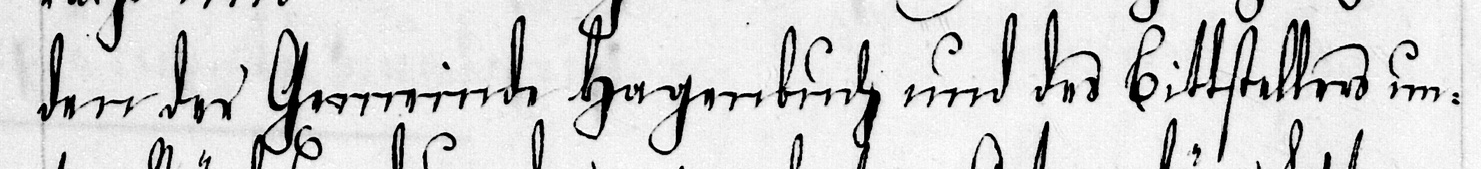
den der Gemeinde Hagenbuch und des Bittstellers un¬
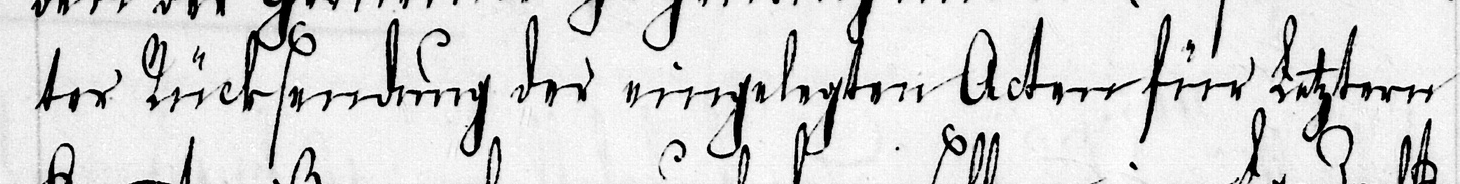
ter Rücksendung der eingelegten Acten für Letztern
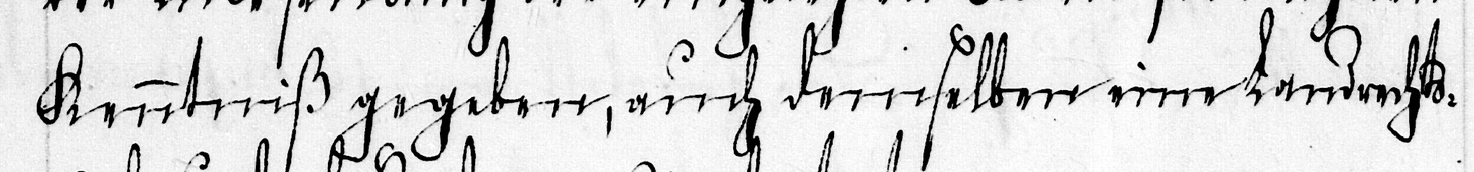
Kenntniß gegeben, auch demselben eine Landrechts¬
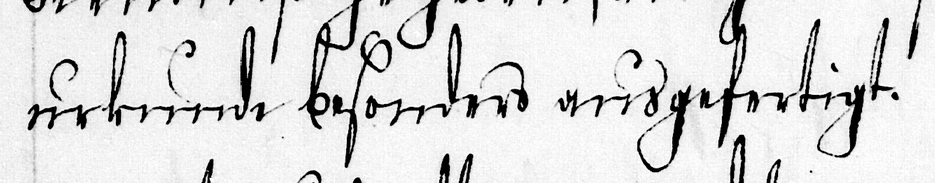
urkunde besonders ausgefertigt.
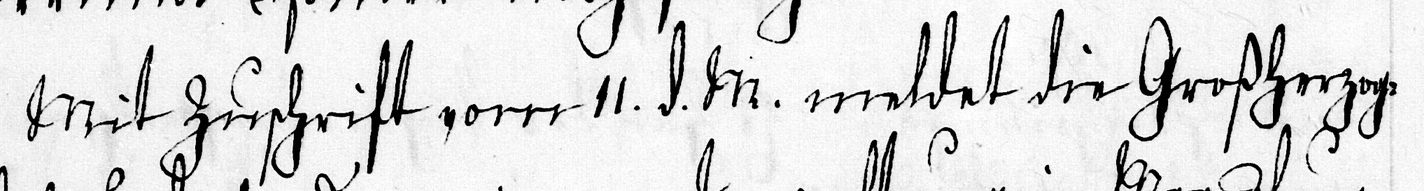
Mit Zuschrift vom 11. d. M. meldet die Großherzog¬
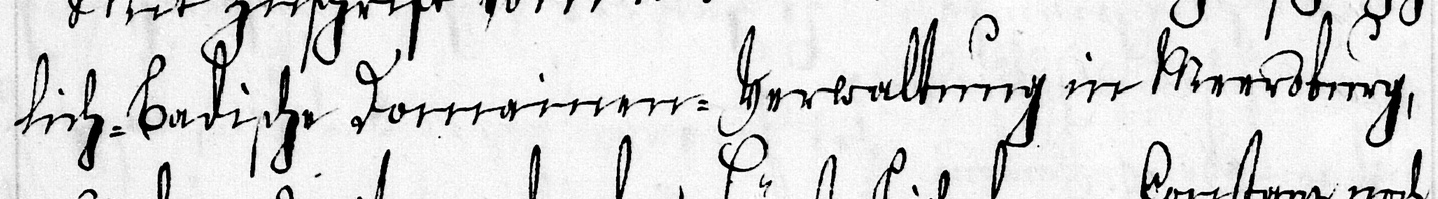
lich-Badische Domainen-Verwaltung in Meersburg,
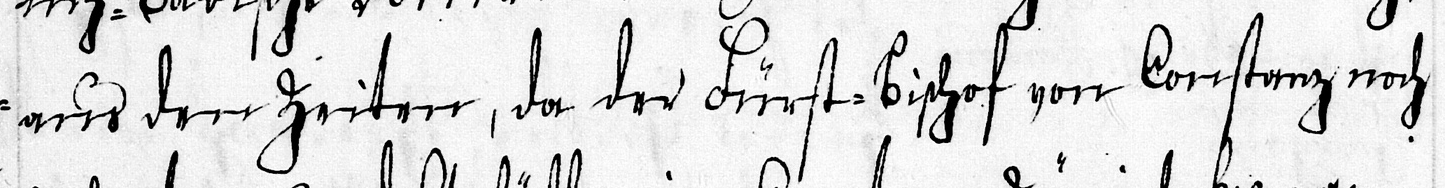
aus den Zeiten, da der Fürst-Bischof von Constanz noch
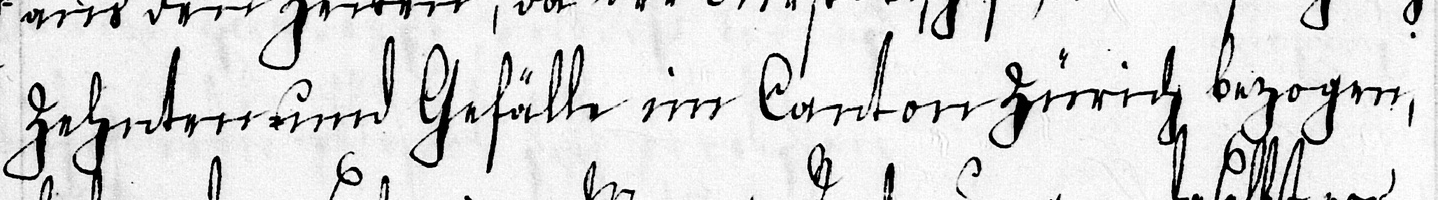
Zehnten- und Gefälle im Canton Zürich bezogen,
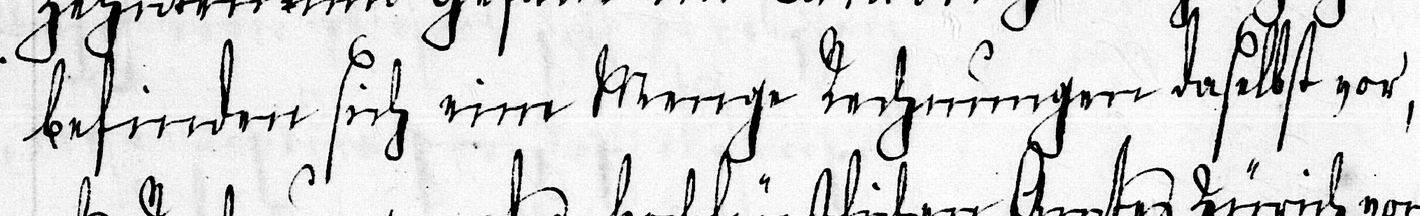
befinden sich eine Menge Rechnungen daselbst vo¬
